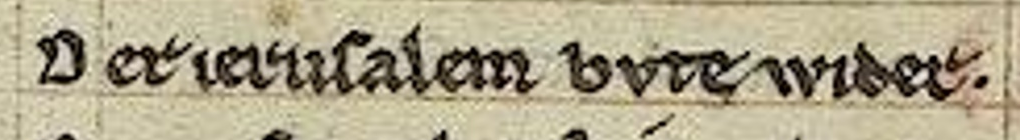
Der ieruſalem bvte wider.
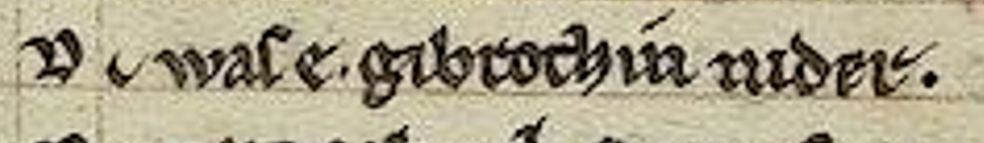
D(az) waſ e gibrochin nider.
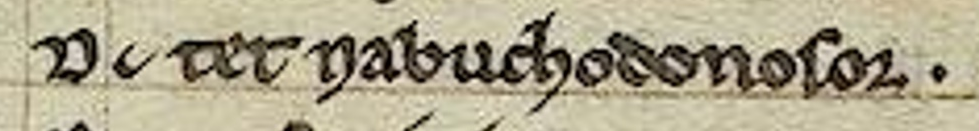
D(az) tet nabuchodonoſor.
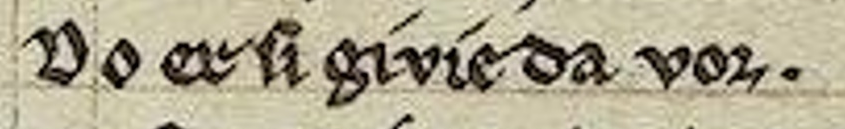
Do er ſi givie da vor.
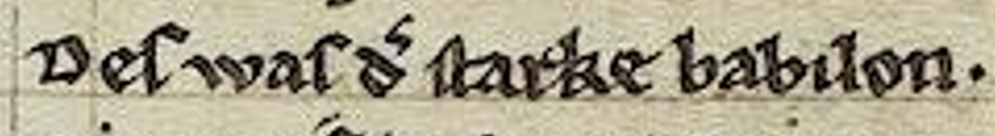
Deſ waſ d(er) ſtarke babilon.
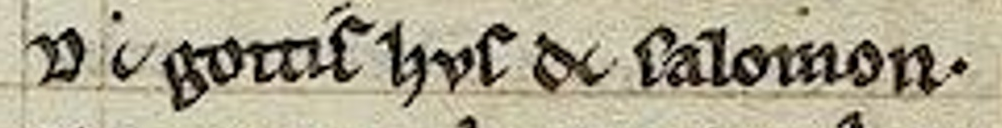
D(az) gottiſ hvſ d(az) ſalomon.
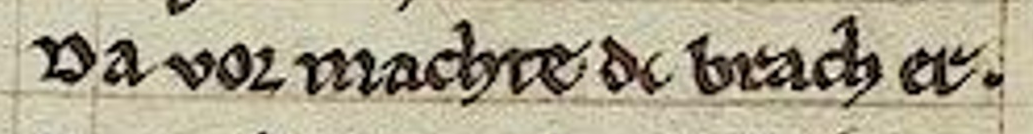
Da vor machte d(az) brach er.
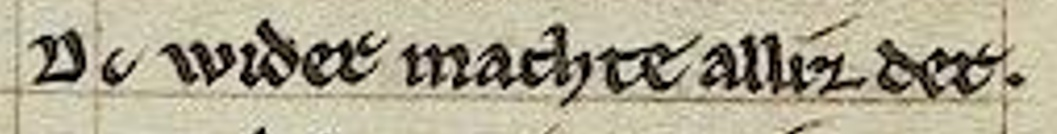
D(az) wider machte alliz der.
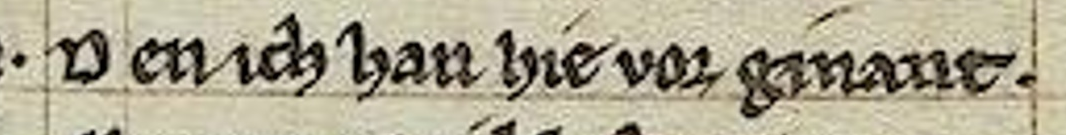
Den ich han hie vor ginant.
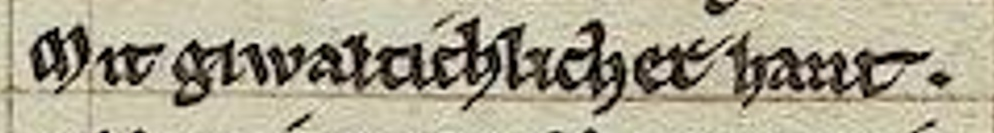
Mit giwaltichlicher hant.
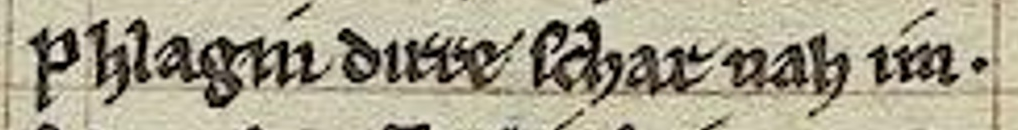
Phlagin dirre ſchar nah ihm.
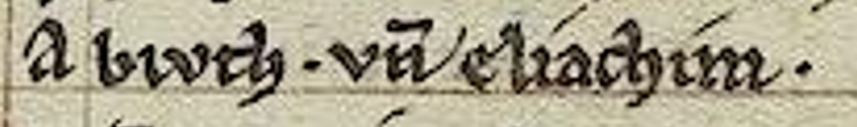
Abiuth. vn(d) eliachim.
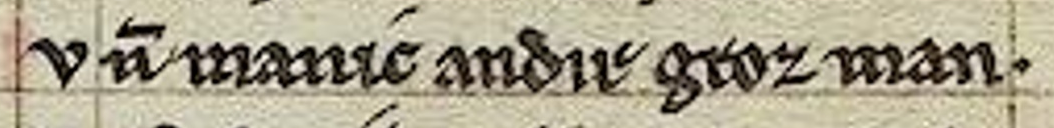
Vn(d) manic andir groz man.
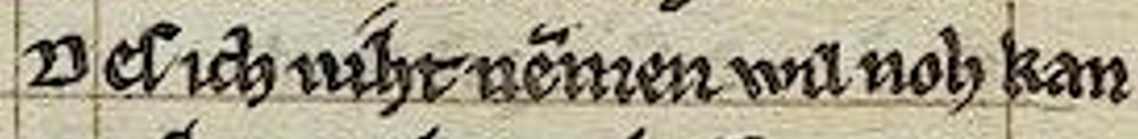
Deſ ich niht ne(m)men wil noh kan.
